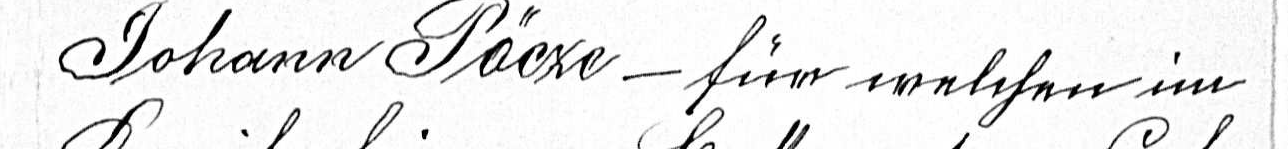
Johann Pöcze – für welchen im
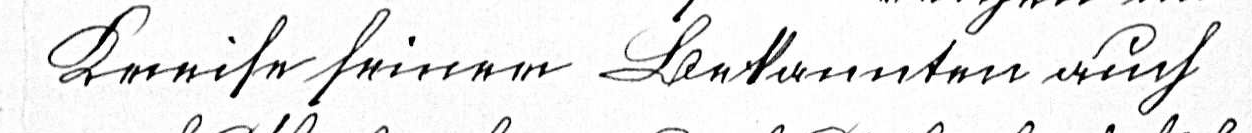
Kreise seiner Bekannten auch
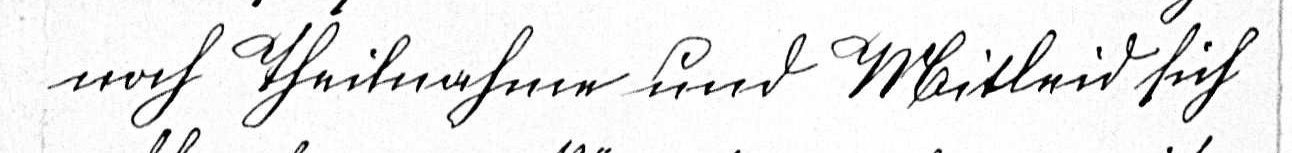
noch theilnahme und Mitleid sich
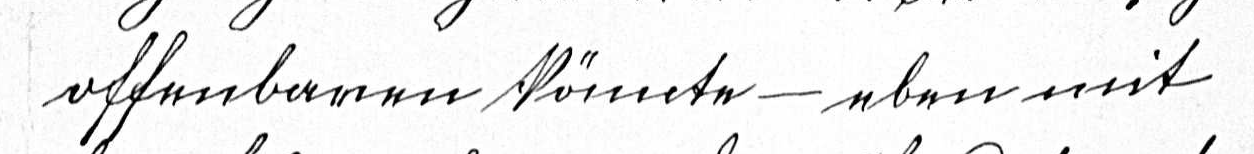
offenbaren könnte – eben mit
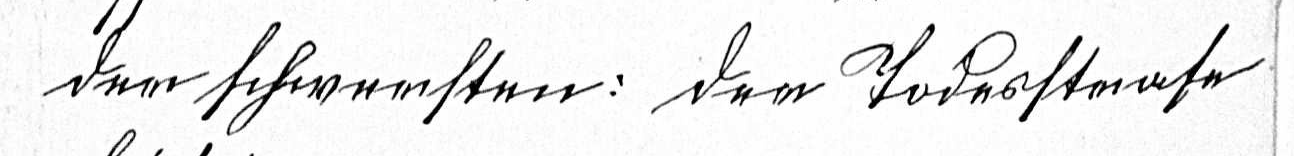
der schwersten: der Todesstrafe
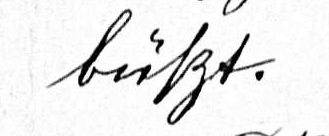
büßt.
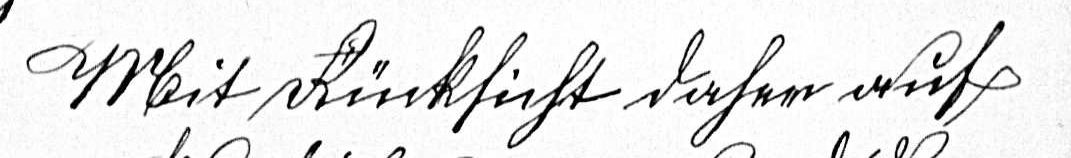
Mit Rücksicht daher auf
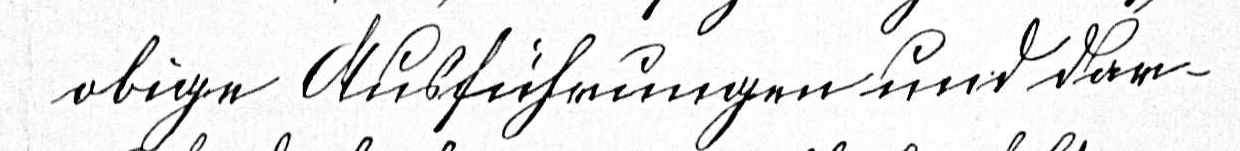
obige Ausführungen und dar¬
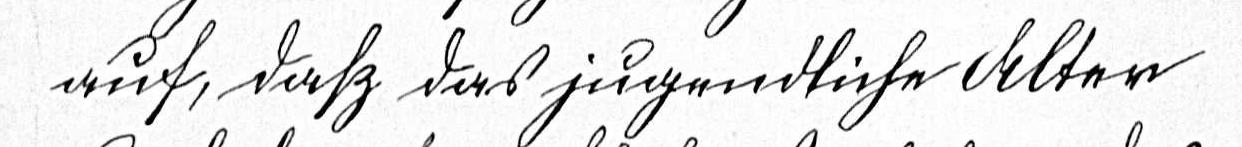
auf, daß das jugendliche Alter
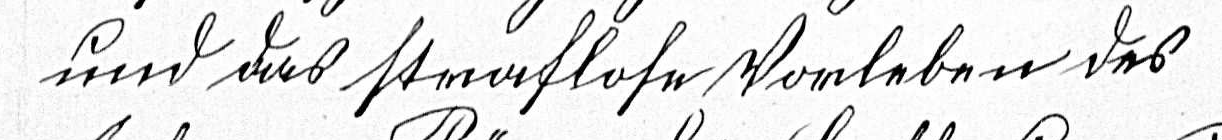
und das straflose Vorleben des
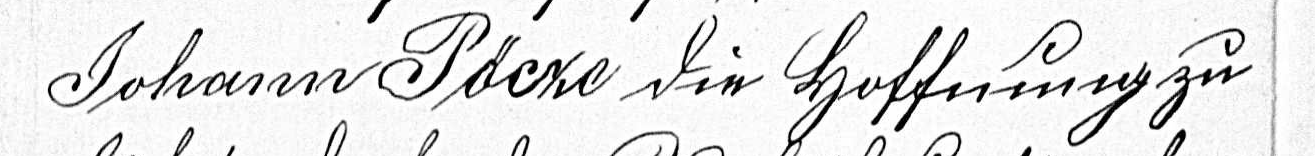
Johann Pöcze die Hoffnung zu¬
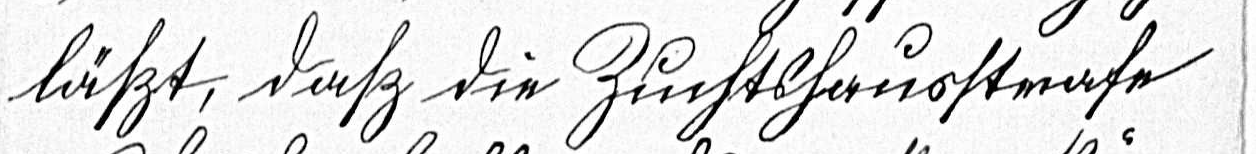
läßt, das die Zuchthausstrafe
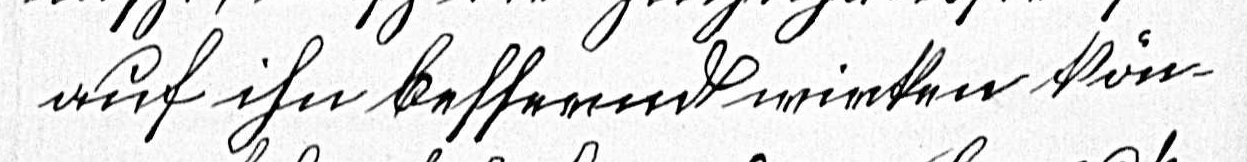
auf ihn bessernd wirken kön¬
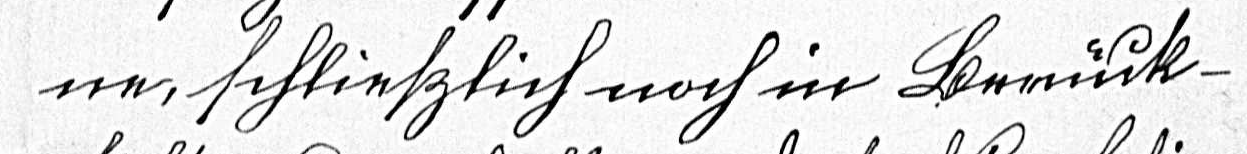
ne, schließlich noch in Berück¬
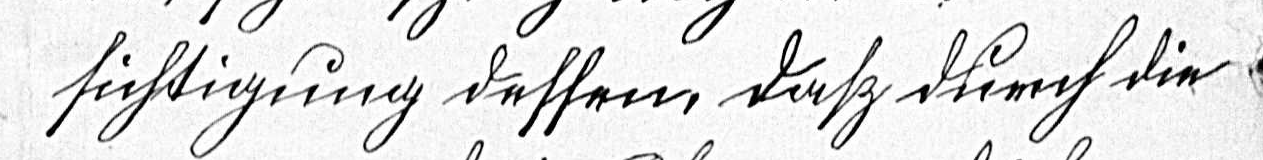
sichtigung dessen, daß durch die
